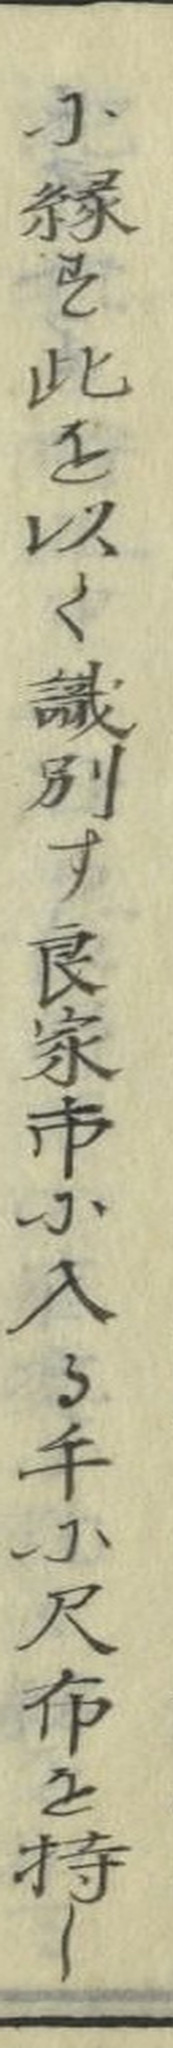に縁す此を以て識別す良家市に入る手に尺布を持し
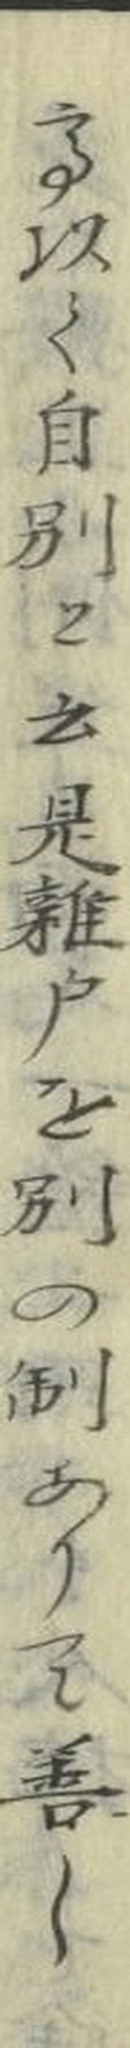て以て自別と云是雑戸を別の制ありて善し
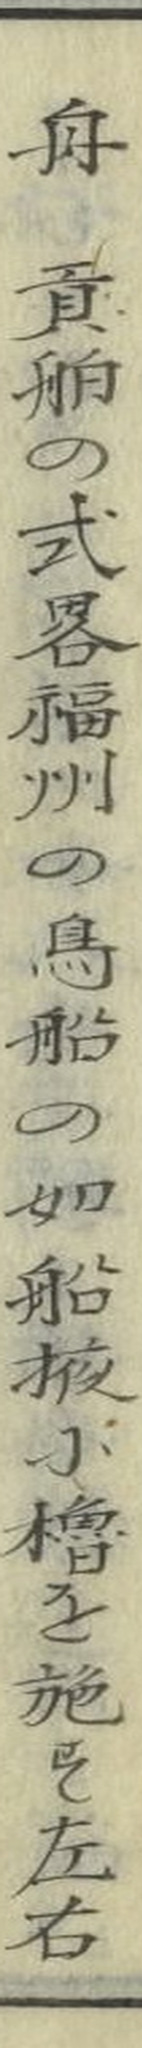舟貢舶の式略福州の鳥船の如船掖に櫓を施す左右
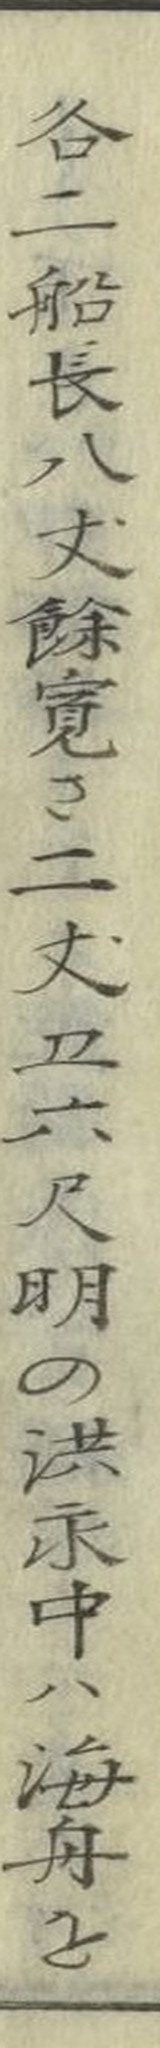各二船長八丈餘寛さ二丈五六尺明の洪永中は海舟を
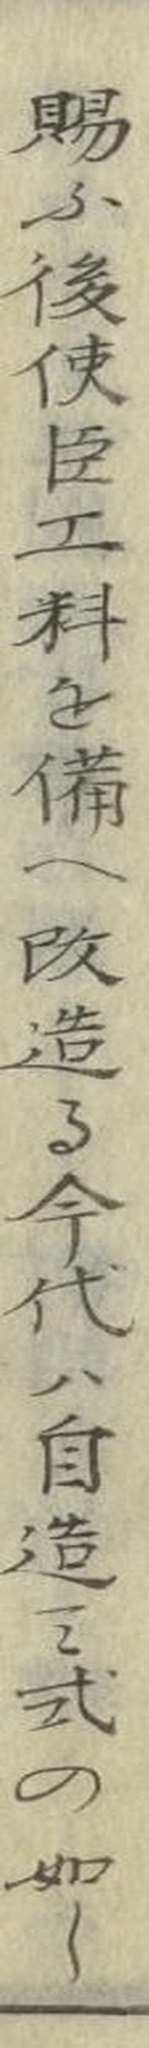賜ふ後使臣工料を備へ改造る今代は自造て式の如し
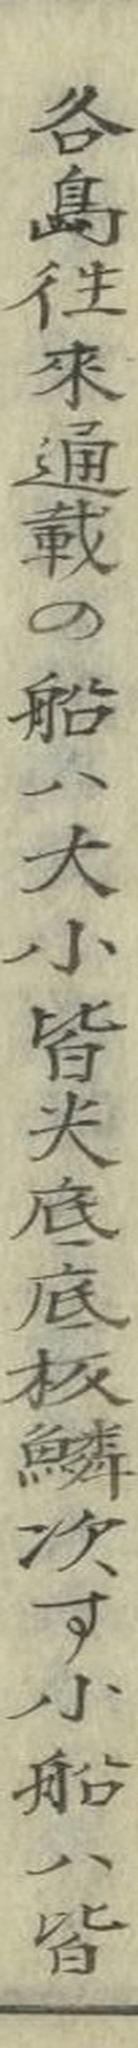各島往来通載の船は大小皆頭底底板鱗次す小船は皆
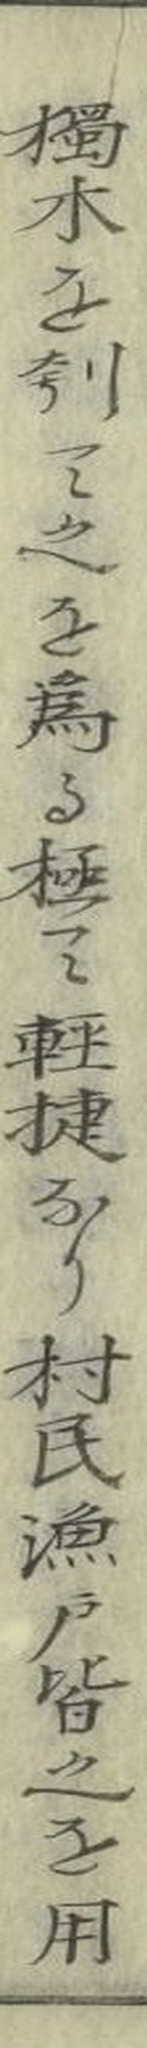獨木を刳て之を為る極て軽捷なり村民漁戸皆之を用
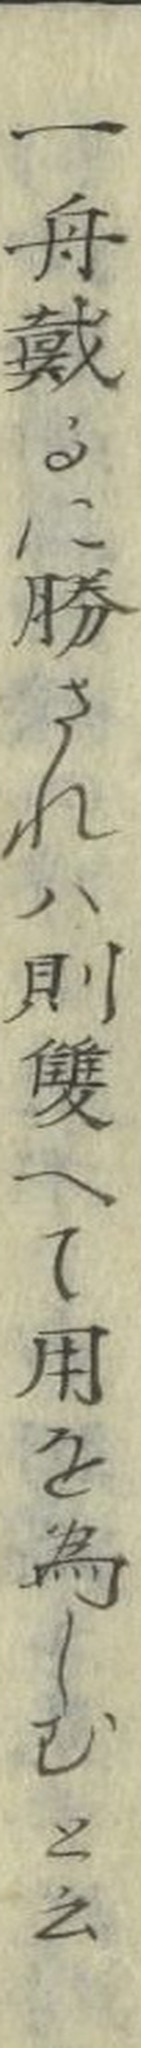一舟戴るに勝されは則双へて用を為しむと云
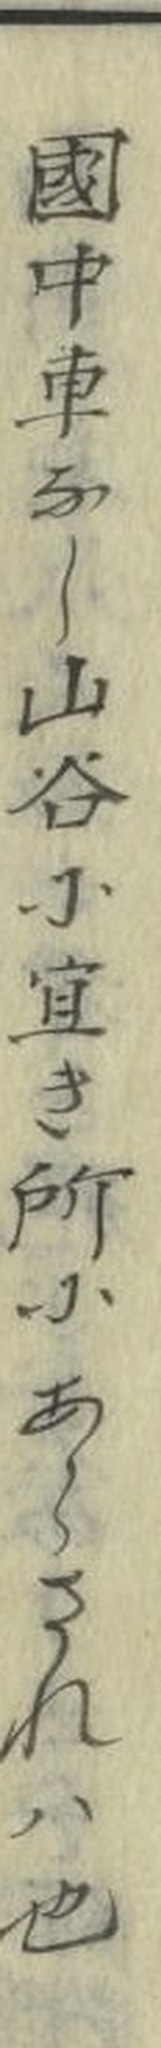国中車なし山谷に宜き所にあらされは也

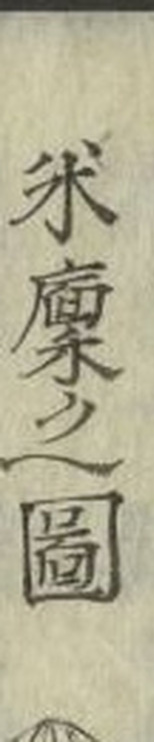米廩之図
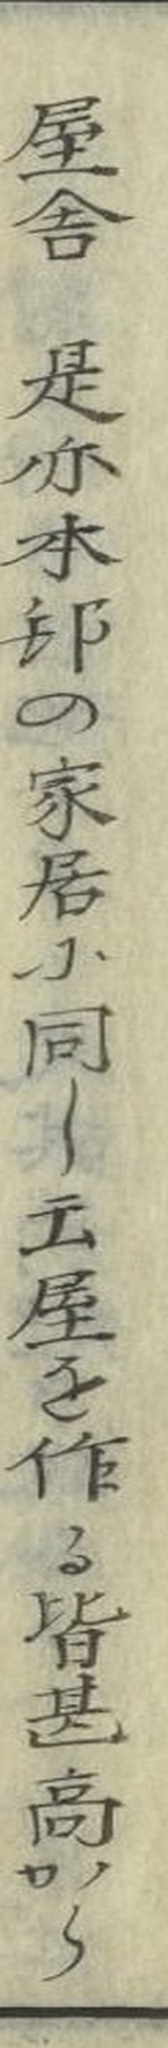屋舎是亦本邦の家居に同し云屋を作る皆甚高から
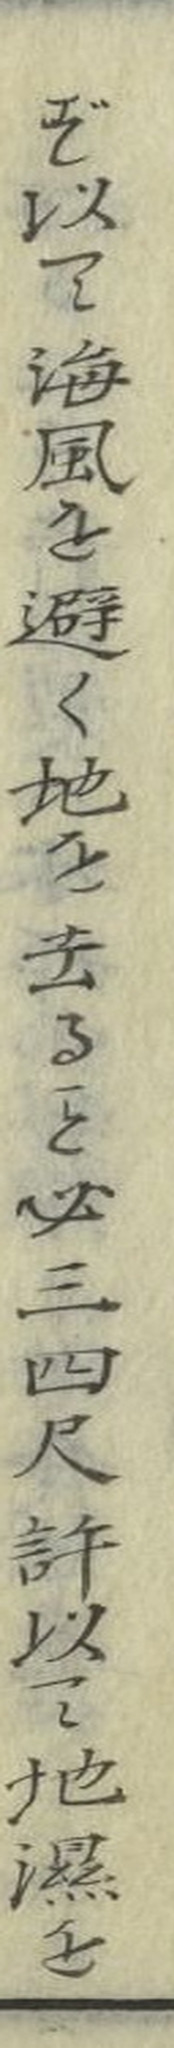ず以て海風を避く地を去ること必三四尺許以て地湿を
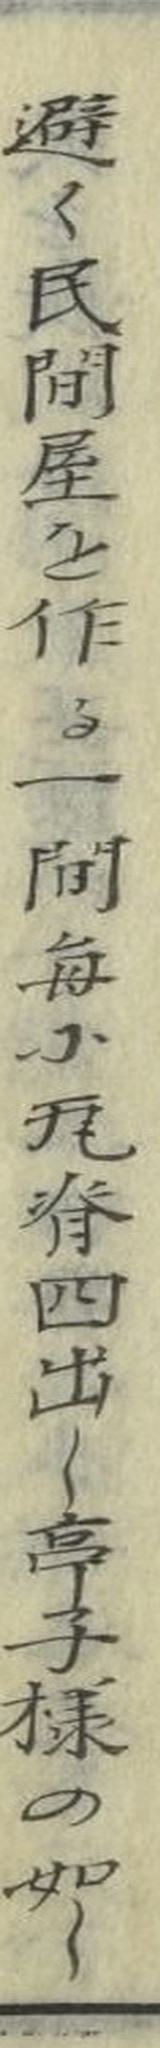避く民間屋を作る一間毎に瓦脊四出し亭子様の如し
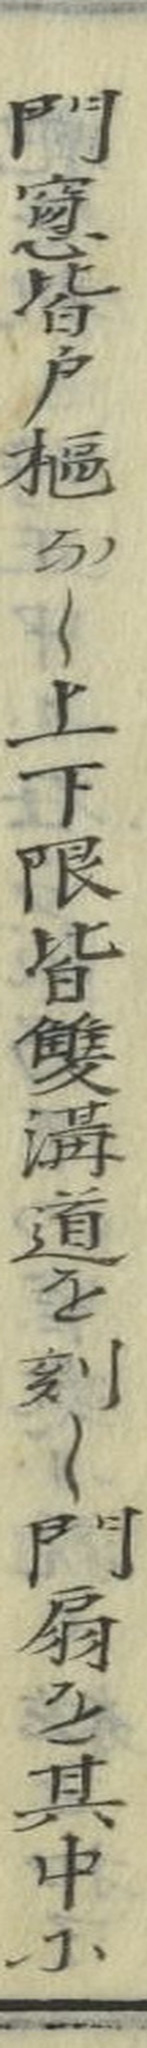門窓皆戸枢なし上下限皆双溝道を刻し門扇を其中に
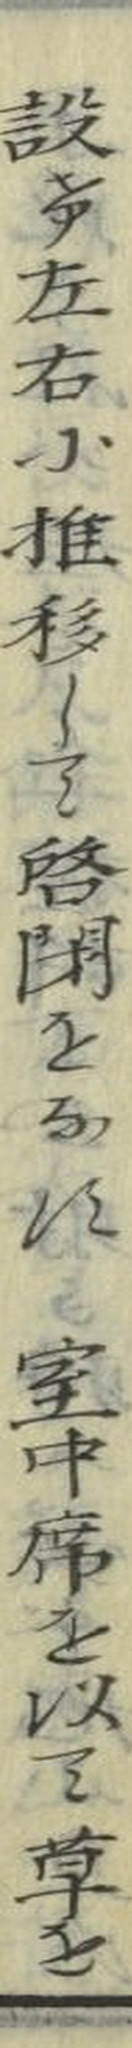設け左右に推移して啓閉をなす室中席を以て草を
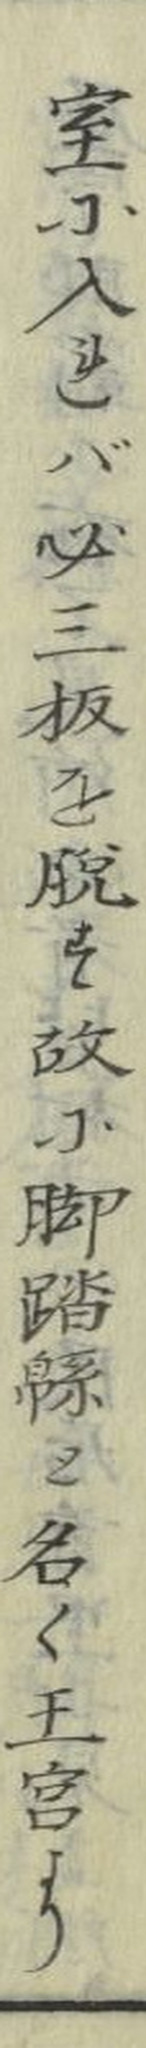室に入れば必三板を脱す故に脚踏緜と名く王宮より
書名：琉球沿革志 上
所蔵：University of the Ryukyus Library
